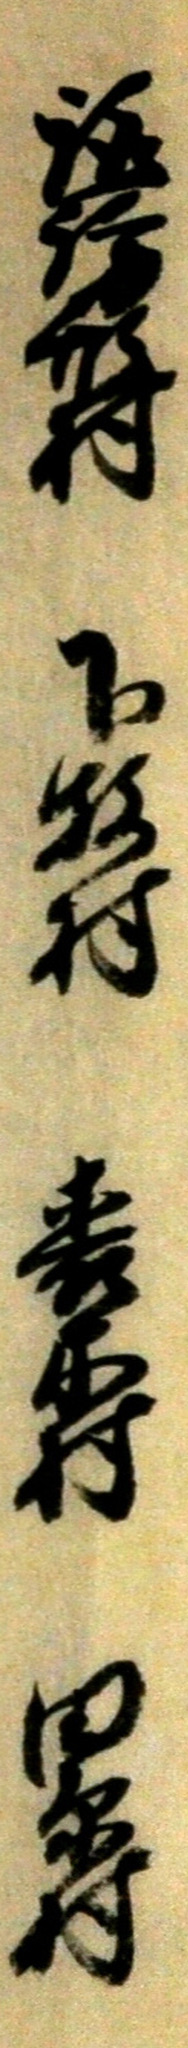諏訪形村下牧村表木村田原村
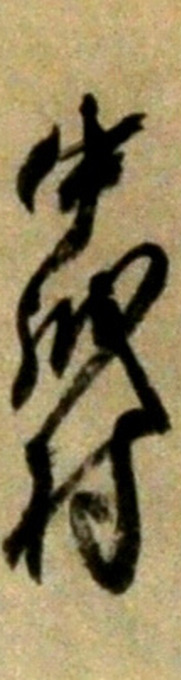中越村
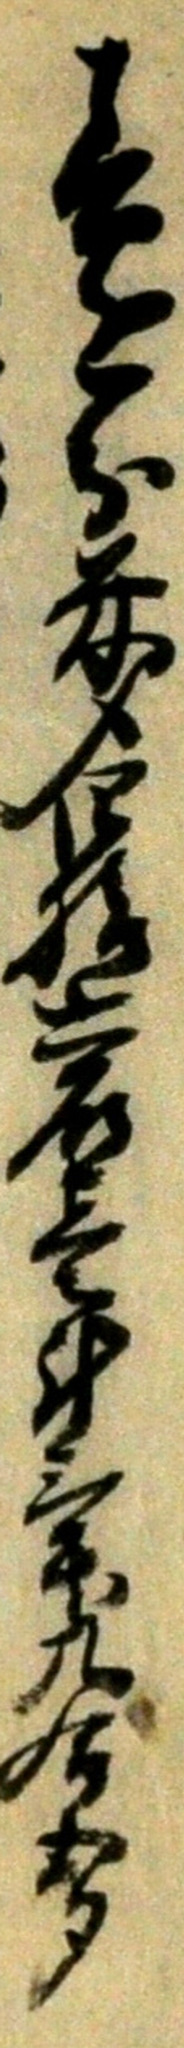春近分米〆四拾六石壱斗三升九合五勺
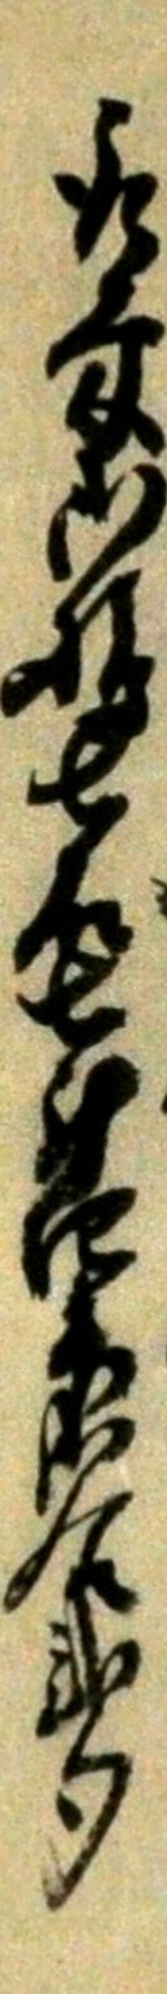取米弐拾七石七斗四升弐合弐勺
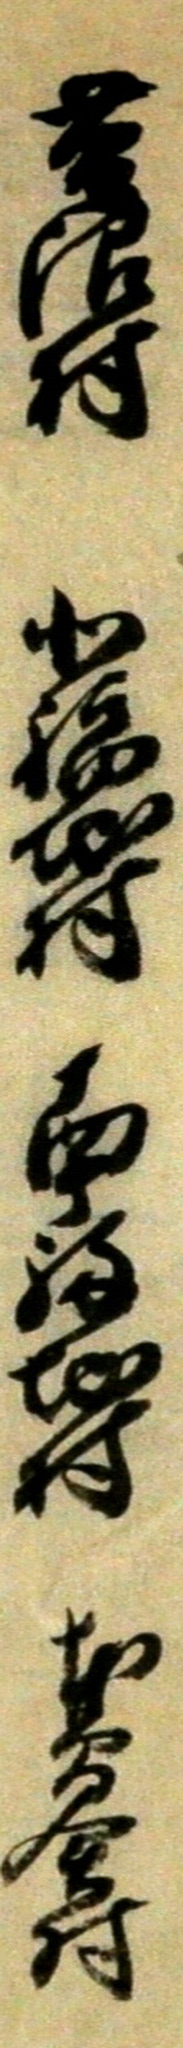菅沼村北福地村南福地村本曽倉村
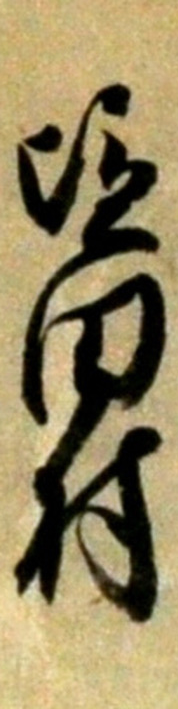塩田村
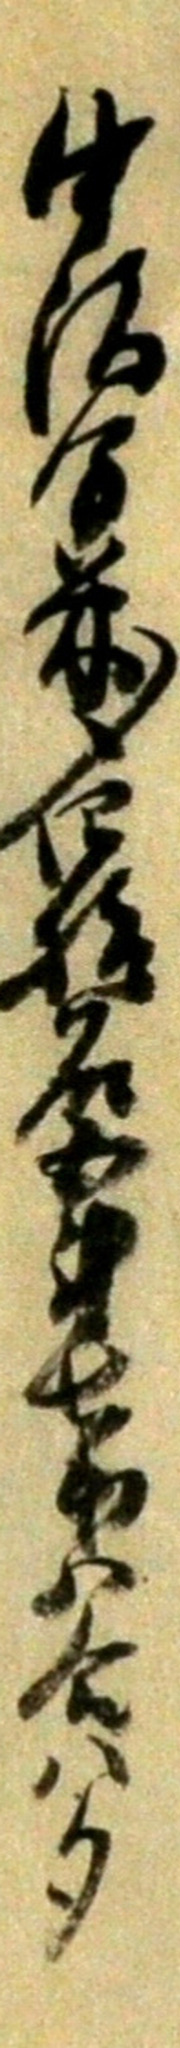中沢分米〆四拾石五斗七升八合八勺
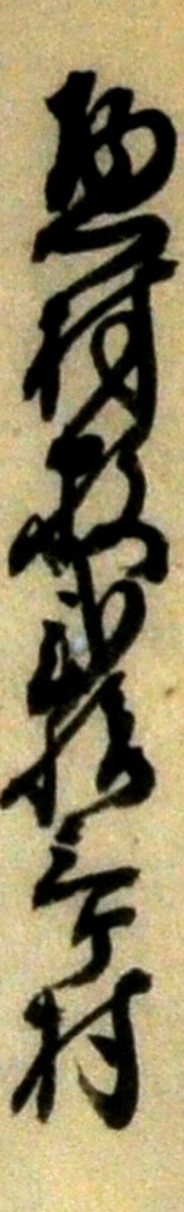惣村数弐拾三ヶ村
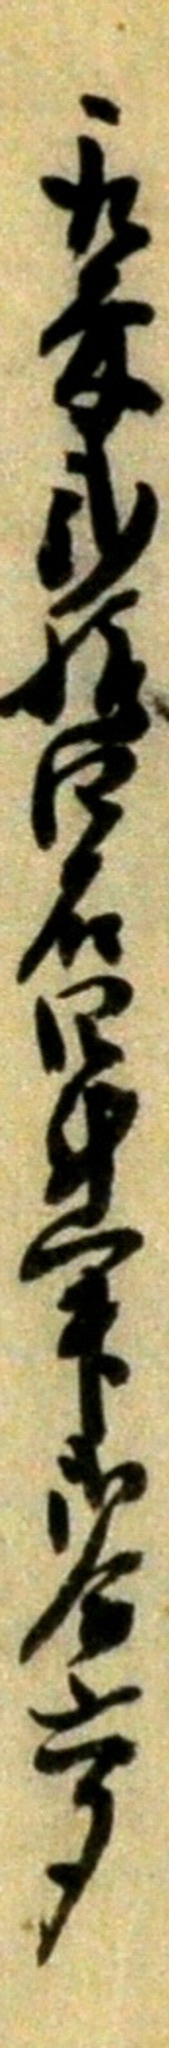取米弐拾四石四斗一升弐合六勺
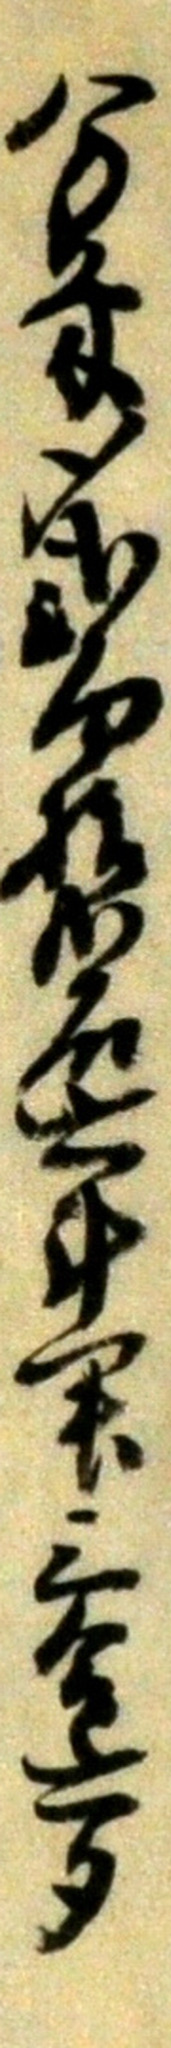分米〆弐百拾弐石六斗一升三合六勺
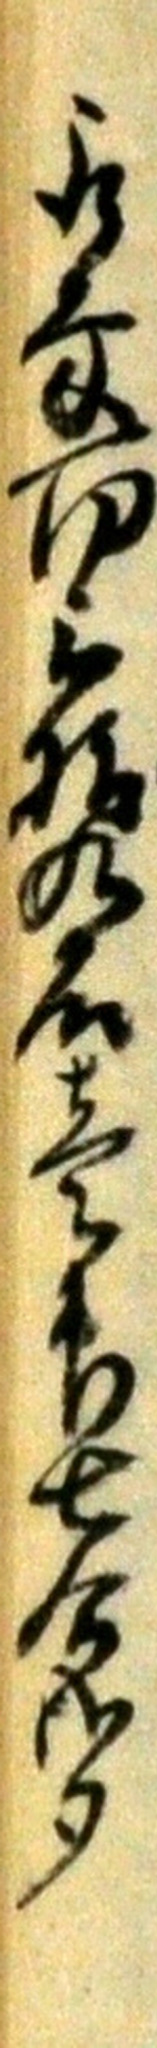取米百三拾九石壱升七合弐勺
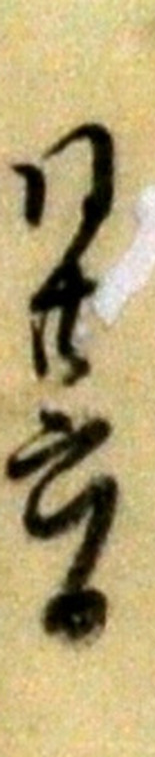同廿六日
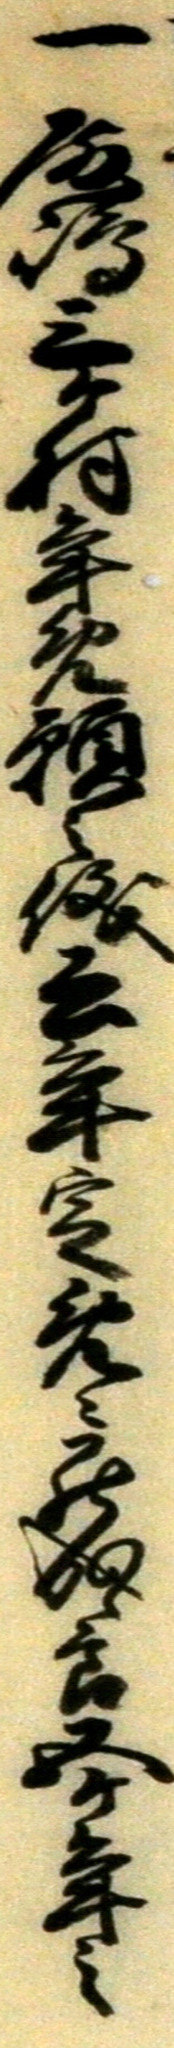一殿嶋三ヶ村年免願之儀定免ニ罷成候節五ヶ年之
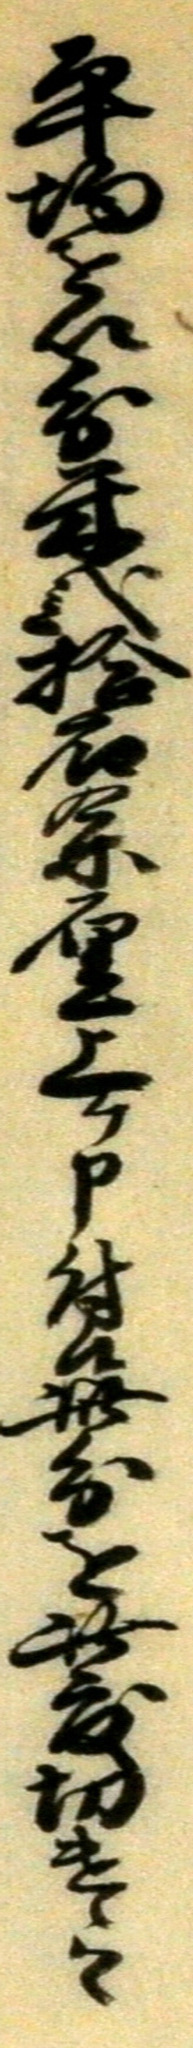平均を以分米弐拾石余厘上ヶ申付候此分を此度切遣候ハヽ
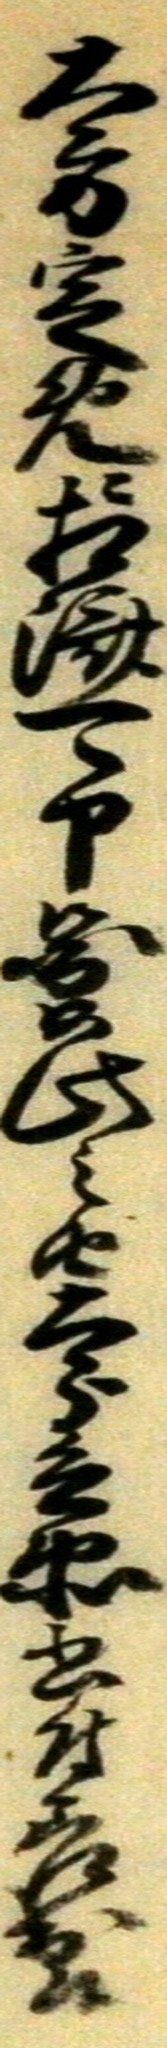大方定免ニ相済可申図如此之由太郎兵衛書付差出候
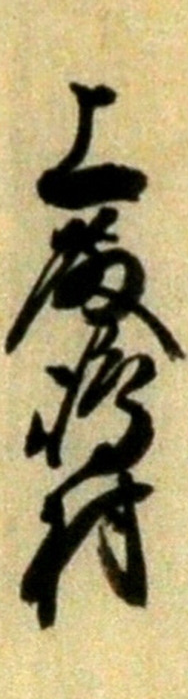上殿嶋村
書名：留書
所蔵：伊那市立高遠町図書館・合同会社AMANE
